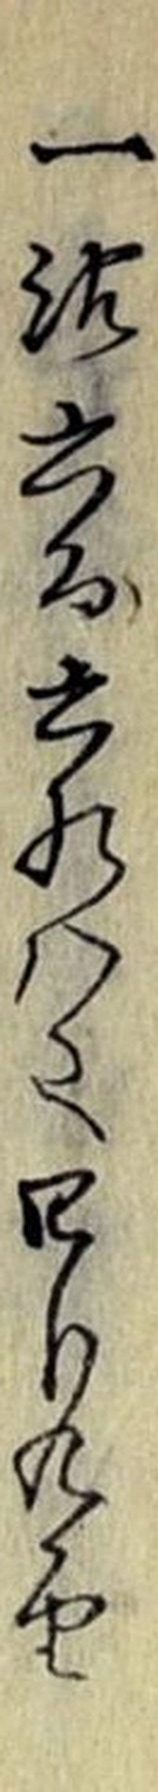一銀六百六拾八匁四分九厘
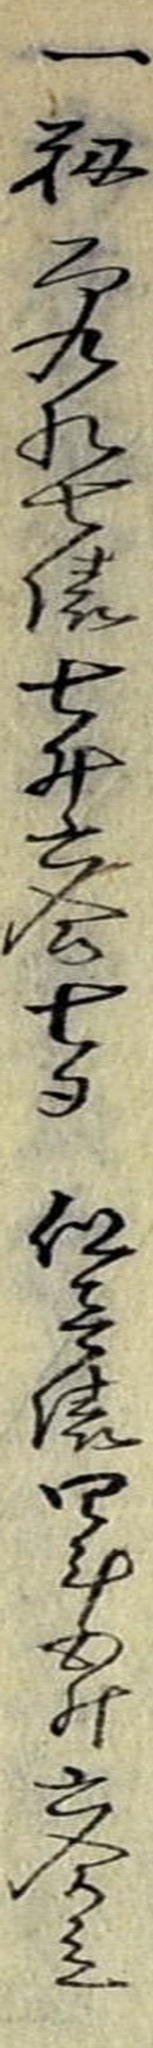一籾百九拾七俵七升六合七勺但壱俵四斗五升六合立
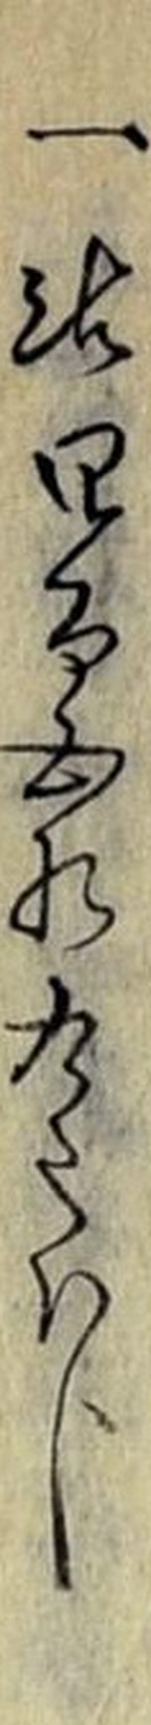一銀四百五拾九匁八分
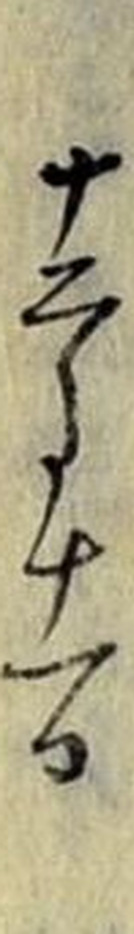十二月十一日
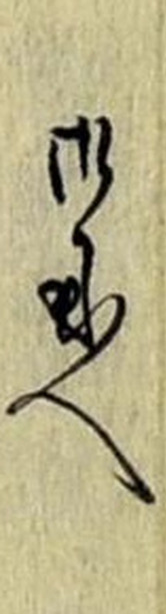御用人
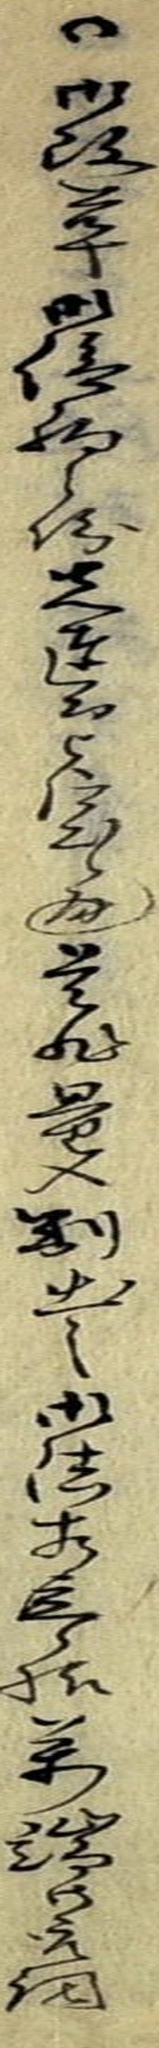〇御改革御倹約之儀先達而被仰出候通是非量入制出之御法相立候様万端御取調
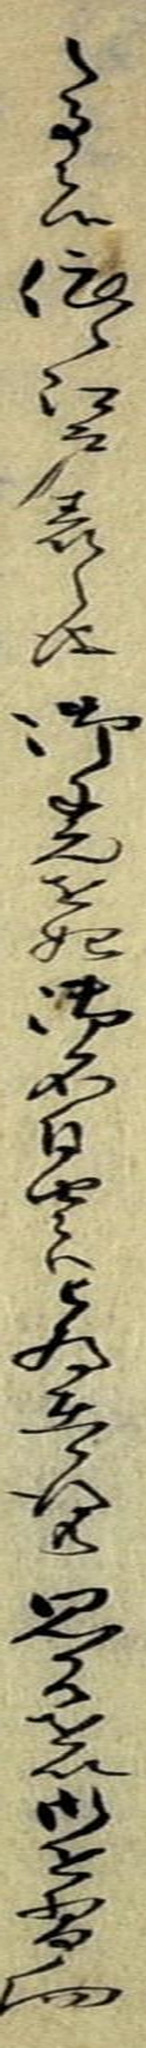之事ニ候依之江戸表之儀御手元を始御不自由ニハ被為在候得共思召を以御近習向
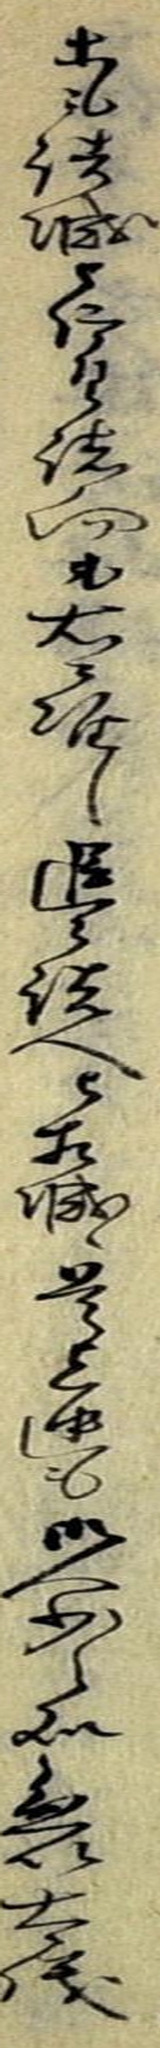等も詰減被仰付候諸向も右ニ准し追々詰人被相減候是迄迚も御人少之処愈以太儀
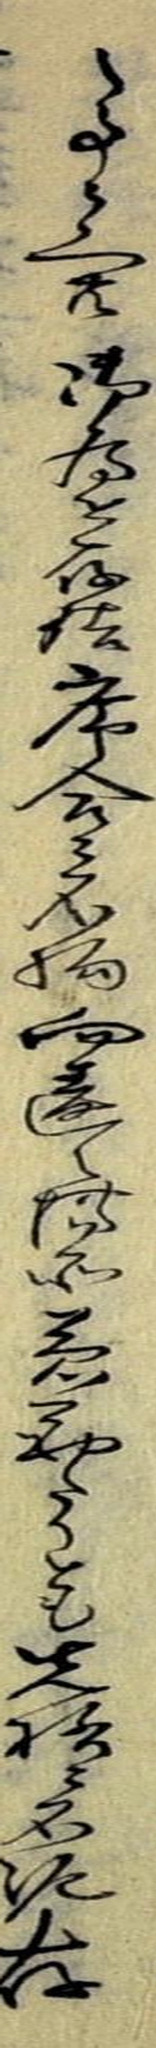之事ニ候へ共御為を存詰席合ニ不拘向違之場所兼勤たりとも先格ニ不泥存
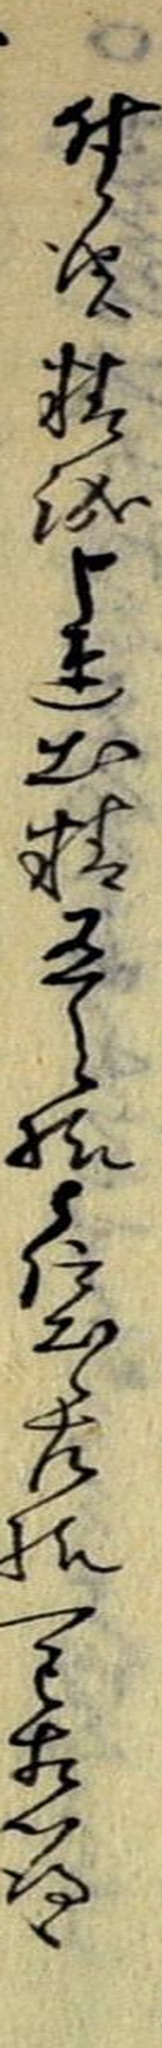付候儀ハ精誠申達出精有之候様被仰出候左様可被相心得候
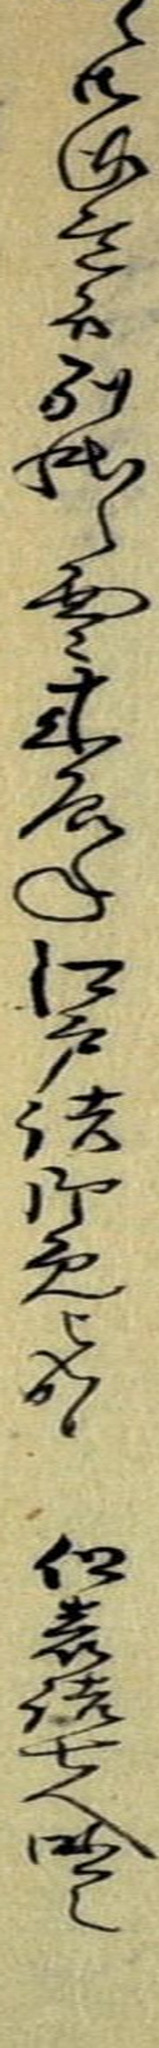一右之御趣意ニ付別紙之面々来辰年江戸詰御免被成候但表詰七人略之
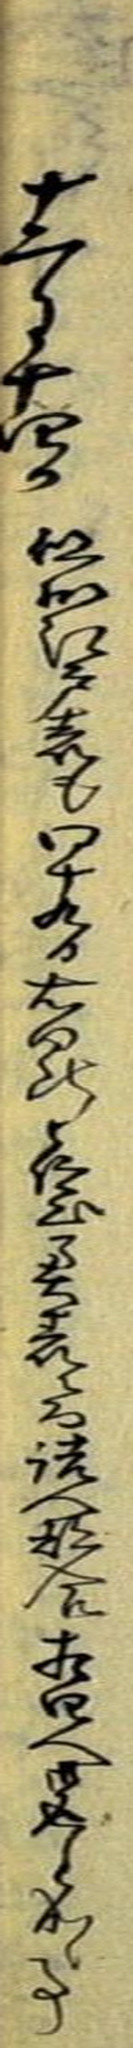十二月十四日但於江戸表も同十九日右同断被仰出奥表ニ而詰人都合拾四人御返被成候事
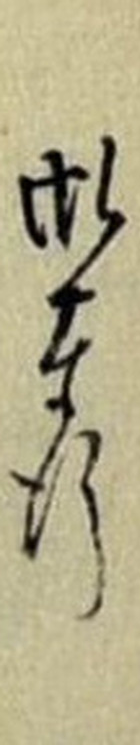御奉行
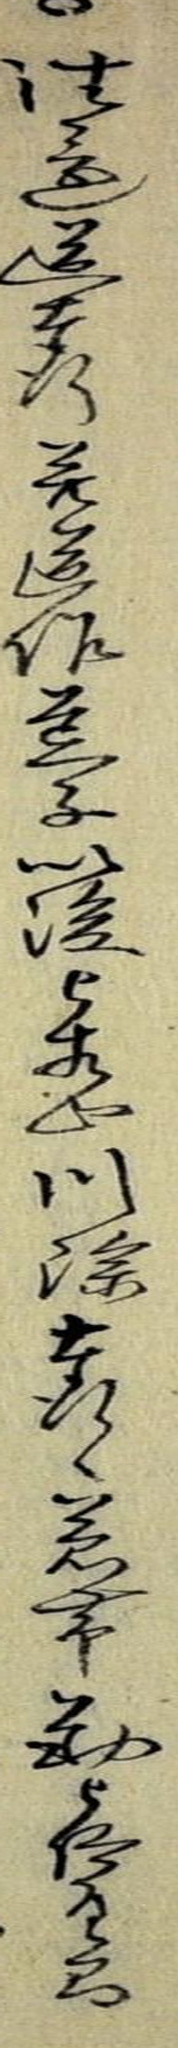〇往還道奉行并道作荒子以後被相止川除奉行へ兼帯勤被仰付候間
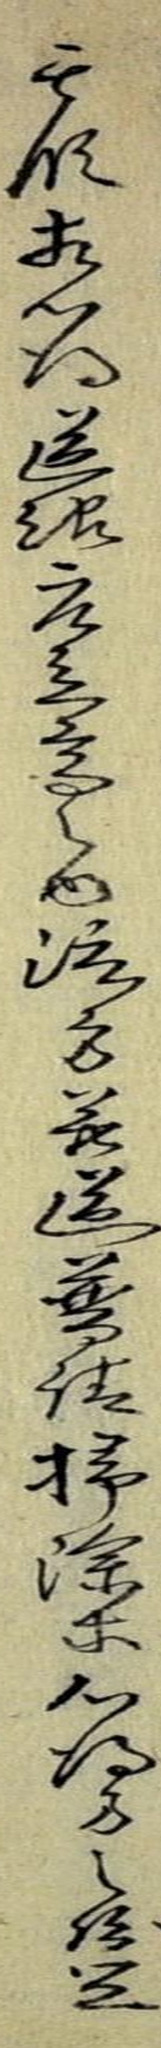其段相心得道銀取立高之内渡方并道普請掃除等心得方之儀宜
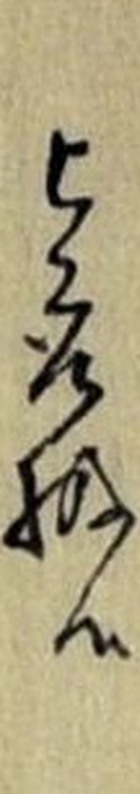被取扱候
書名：命令之部 五
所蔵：福井県文書館 Fukui Prefectural Archives
